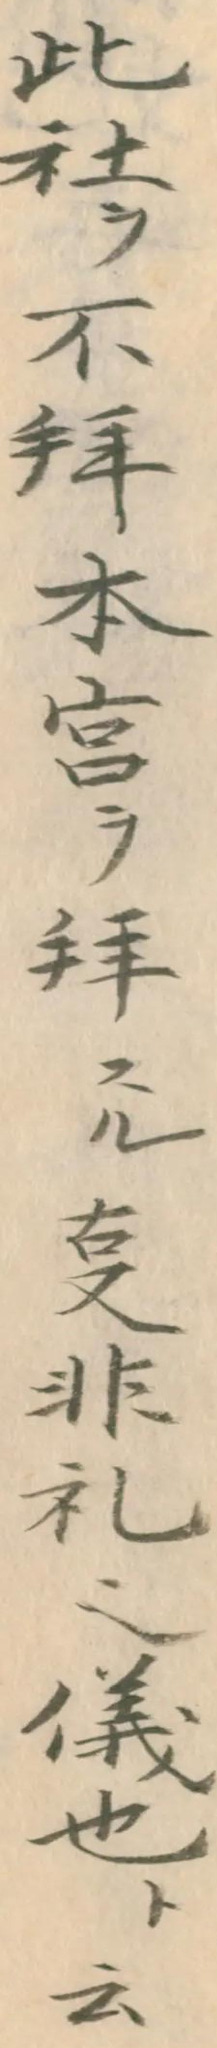此社ヲ不拝本宮ヲ拝スル事非礼也儀也ト云
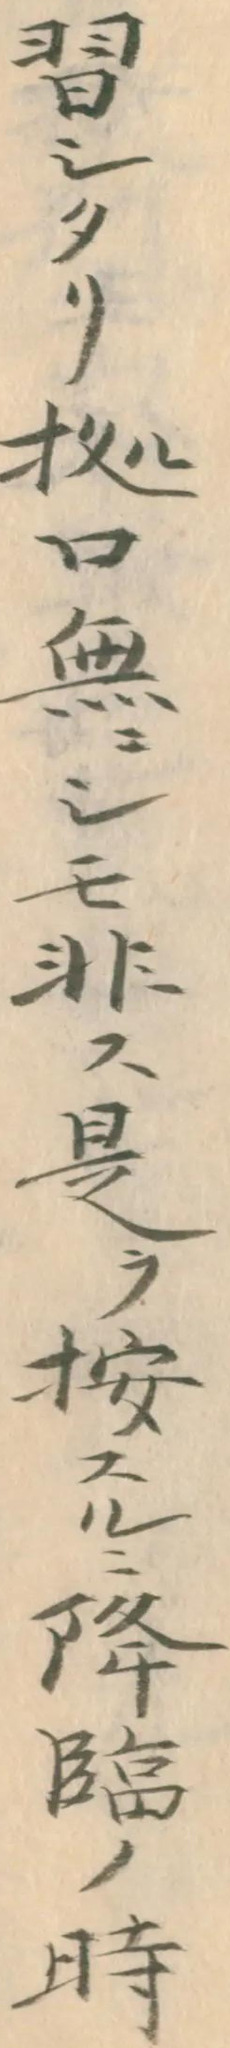習シタリ拠口無ニシモ非ス是ヲ按スルニ降臨ノ時
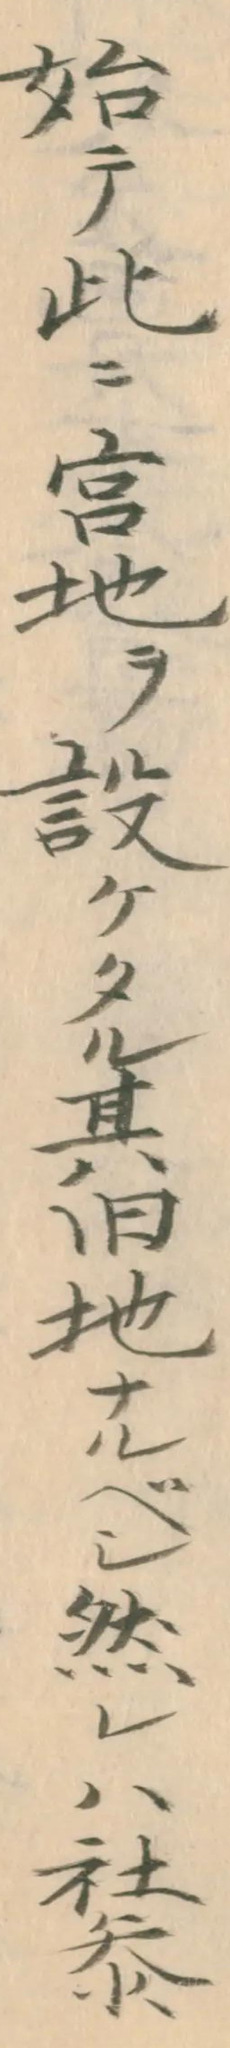始テ此ニ宮地ヲ設ケタル其旧地ナルベシ然レハ社参
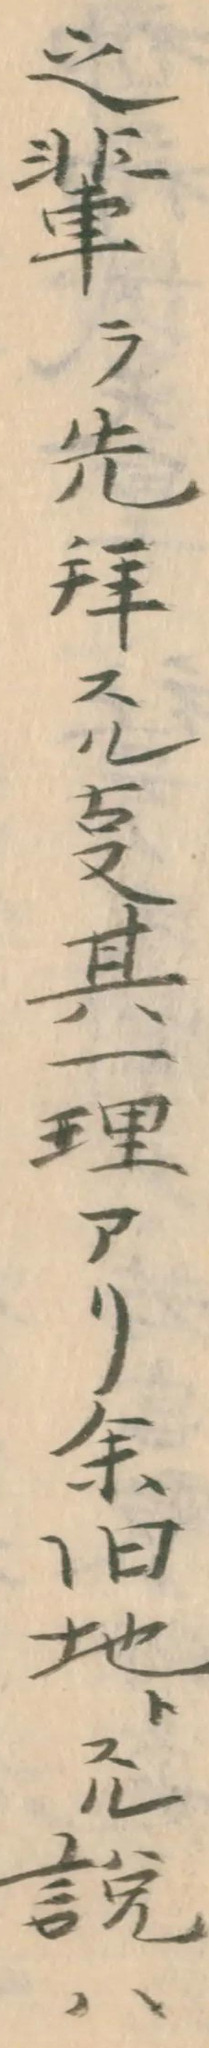之輩ラ先拝スル事其一理アリ余旧地トスル説ハ
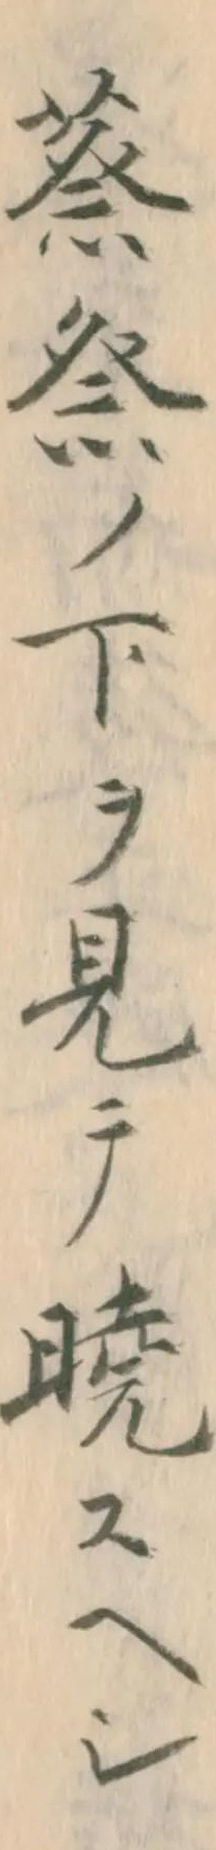葵祭ノ下ヲ見テ暁スヘシ
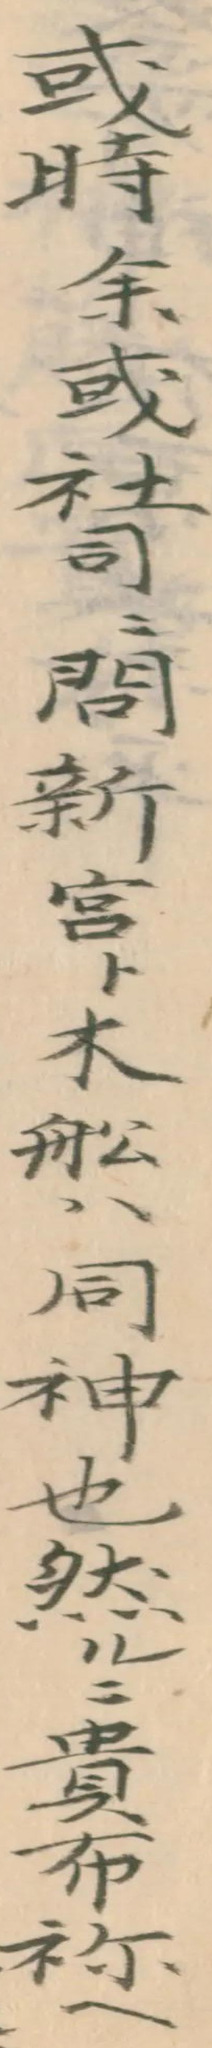或時余或社司ニ問新宮ト木船ハ同神也然ルニ貴布称へ
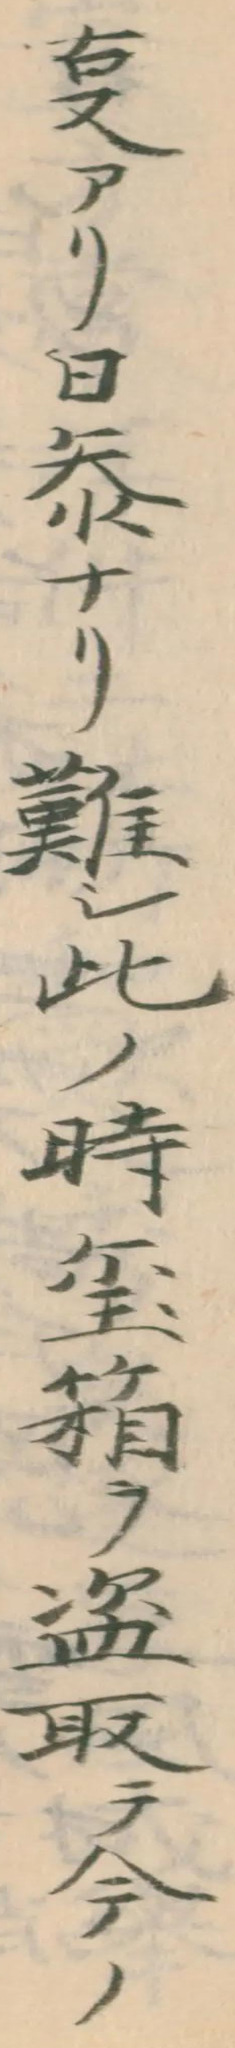事アリ日参ナリ難シ此ノ時璽箱ヲ盗取テ今ノ
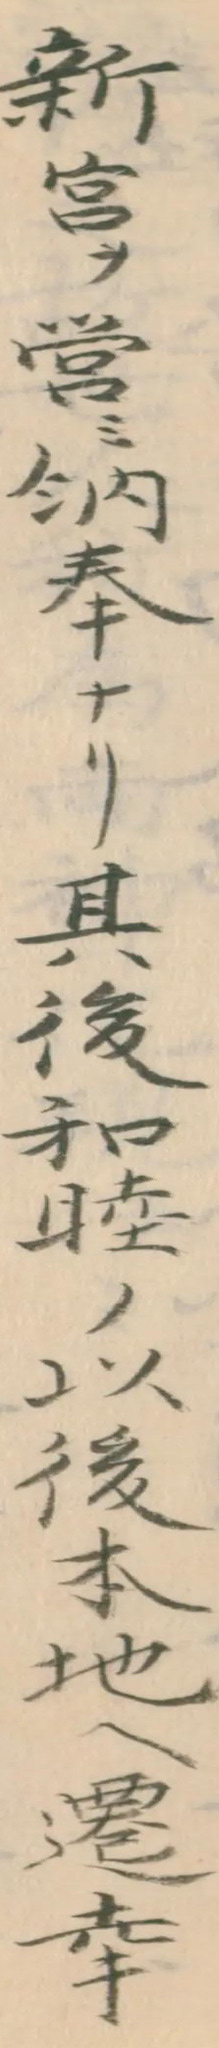新宮ヲ営ミ納奉ナリ其後和睦ノ以後本地ヘ遷幸
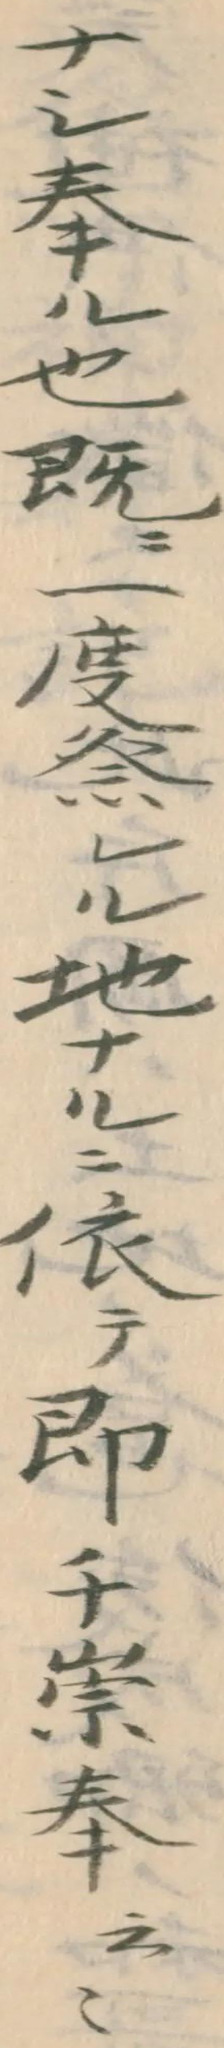ナシ奉ル也既ニ一度祭レル地ナルニ依テ即チ崇奉云々
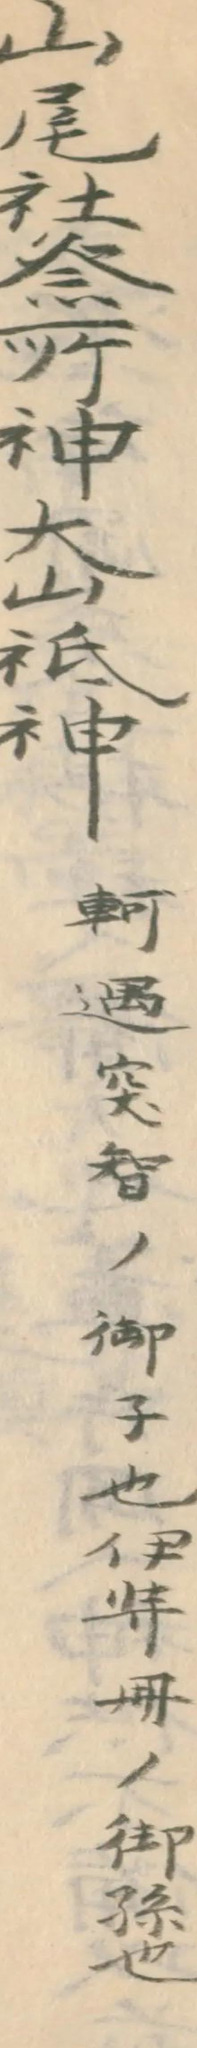山尾社祭所神大山祇神軻遇突智ノ御子也伊弉冊の御孫也
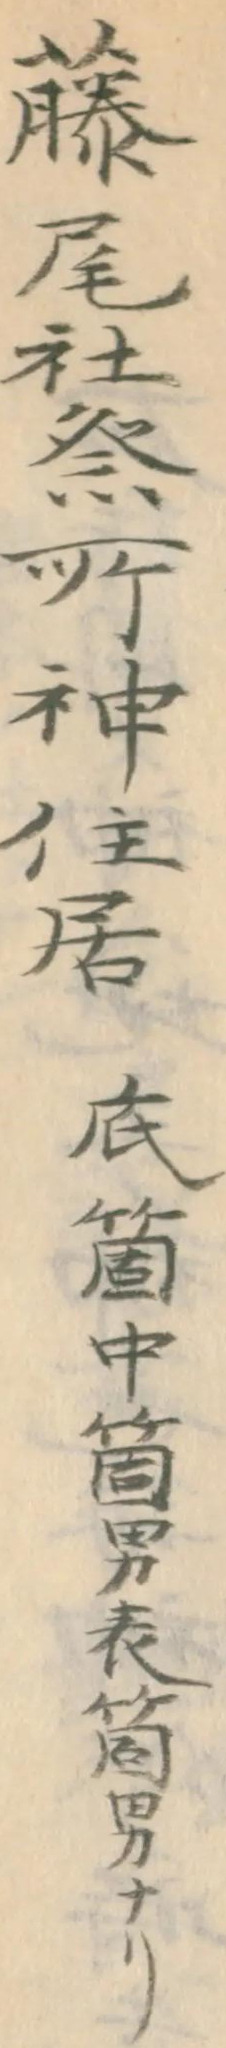藤尾社祭所神住居底箇中箇男表箇男ナリ
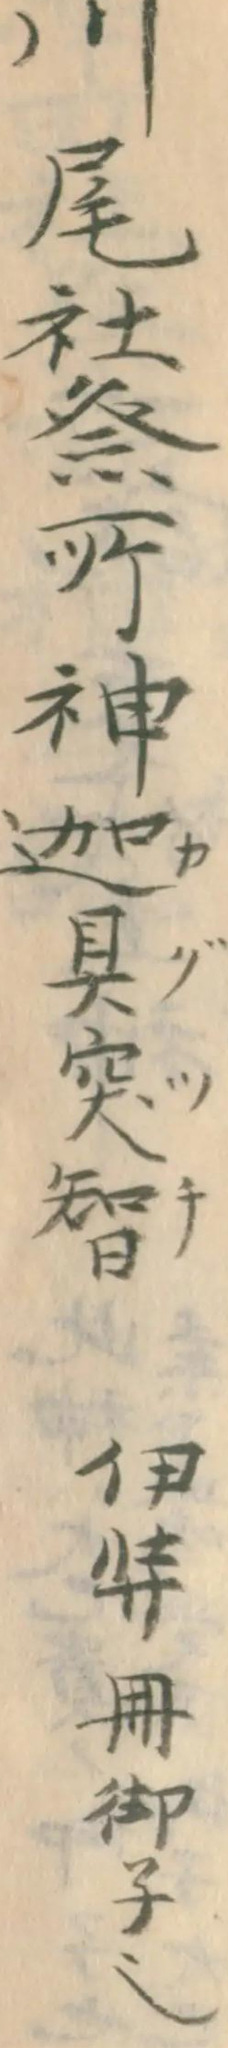川尾社祭所神迦具突智伊弉冊御子也
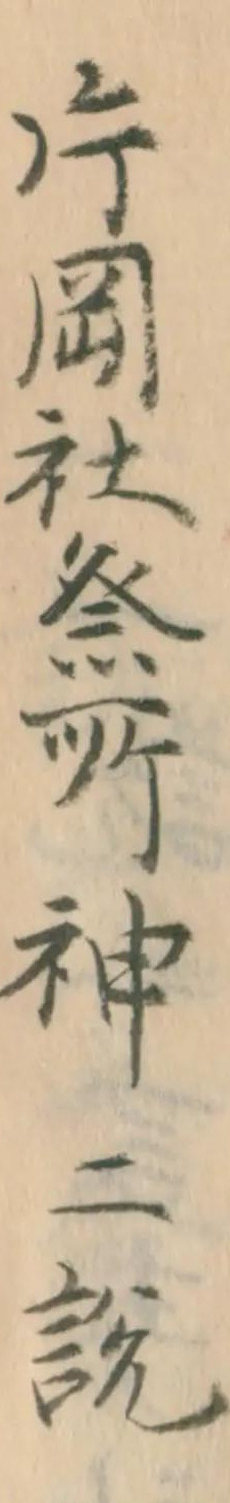片岡社祭所神二説

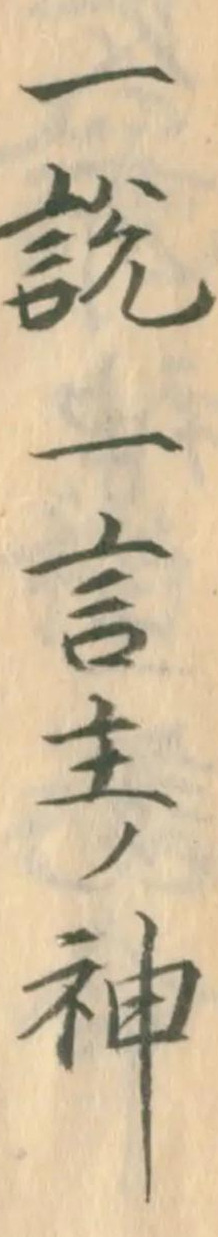一説一言主ノ神
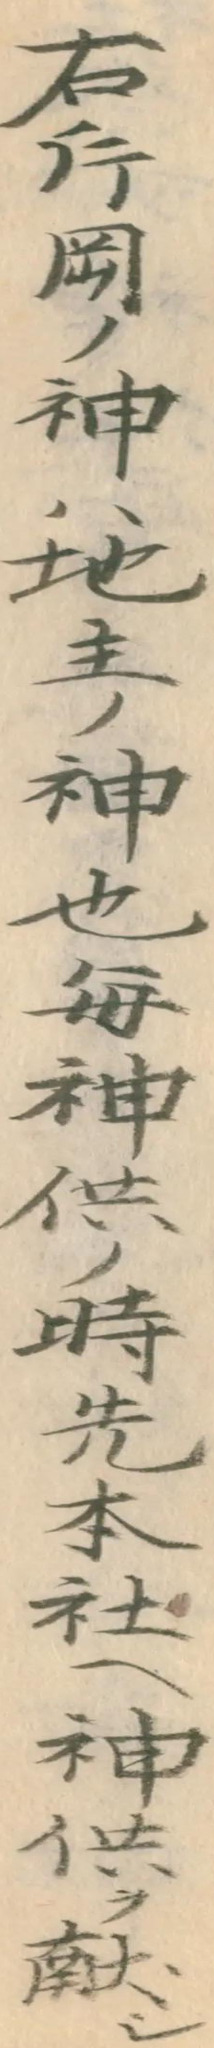右片岡ノ神ハ地主ノ神也毎神供ノ時先本社ヘ神供ヲ献シ
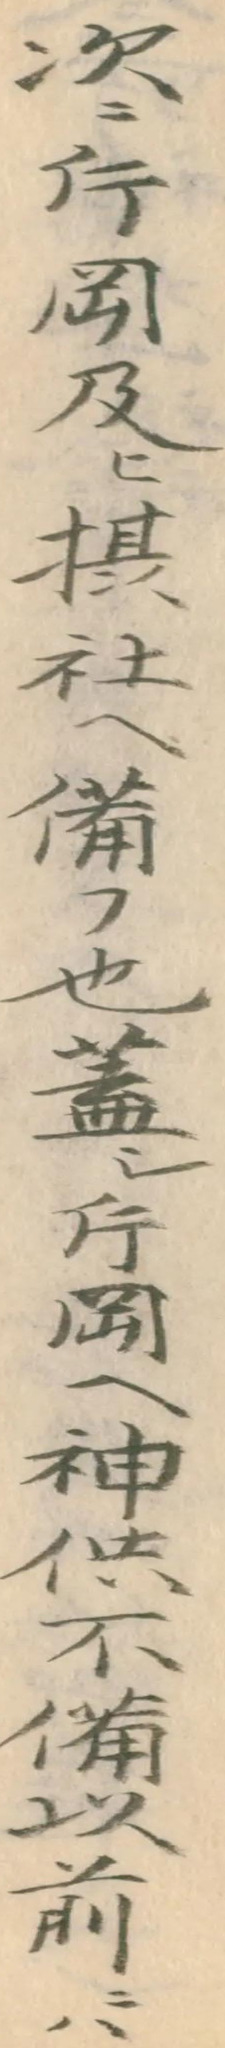次ニ片岡及ヒ摂社ヘ備フ也蓋シ片岡へ神供不備以前ニハ
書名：賀茂社記録. 第91冊
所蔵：国立国会図書館 National Diet Library, JAPAN
